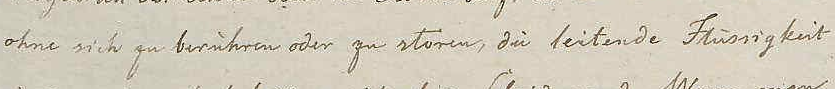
ohne sich zu berühren oder zu stören, die leitende Flüssigkeit
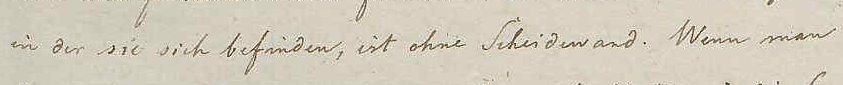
in der sie sich befinden, ist ohne Scheidewand. Wenn man
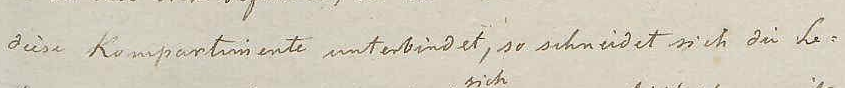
diese Kompartimente unterbindet, so schneidet sich die Le-
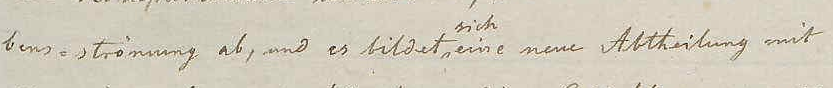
bens-strömung ab, und es bildet sich eine neue Abtheilung mit
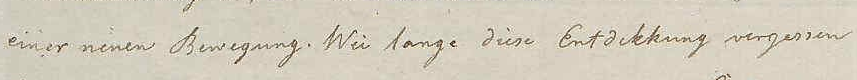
einer neuen Bewegung. Wie lange diese Entdekkung vergessen
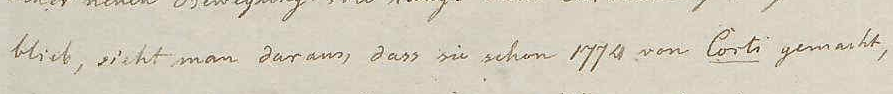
blieb, sieht man daraus, dass sie schon 1774 von Corti gemacht,
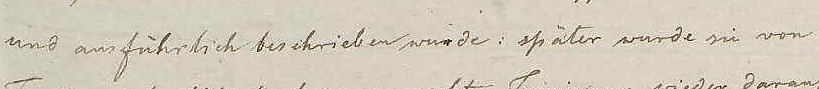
und ausführlich beschrieben wurde: später wurde sie von
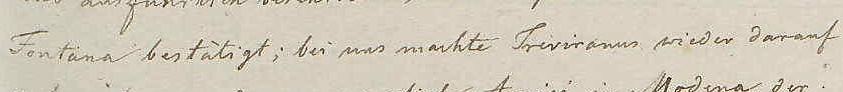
Fontana bestätigt; bei uns machte Treviranus wieder darauf
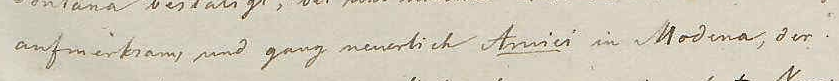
aufmerksam, und ganz neuerlich Amici in Modena, der
